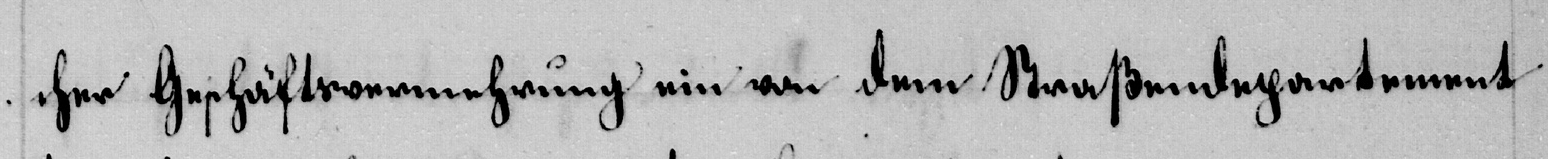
cher Geschäftsvermehrung ein von dem Straßendepartement
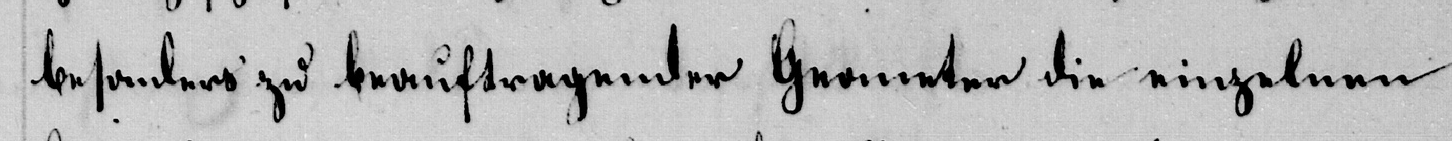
besonders zu beauftragender Geometer die einzelnen
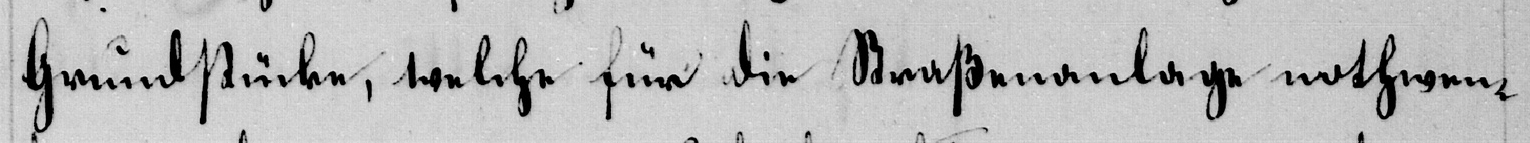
Grundstücke, welche für die Straßenanlage nothwen¬
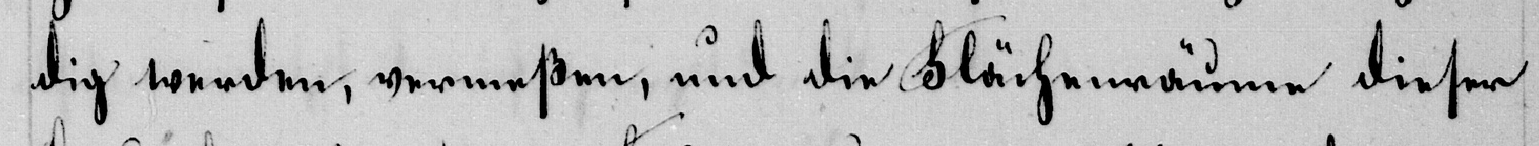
dig werden, vermeßen, und die Flächenräume dieser
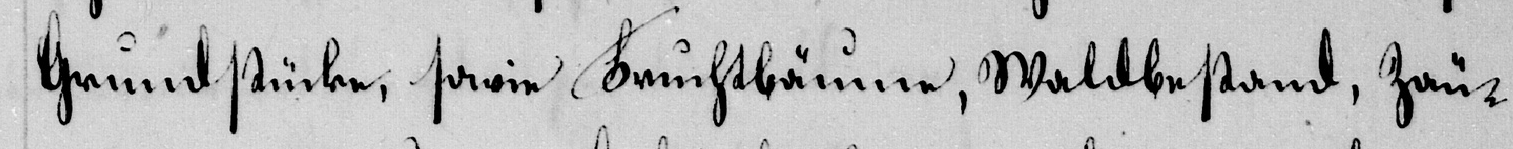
Grundstücke, sowie Fruchtbäume, Waldbestand, Zäu¬
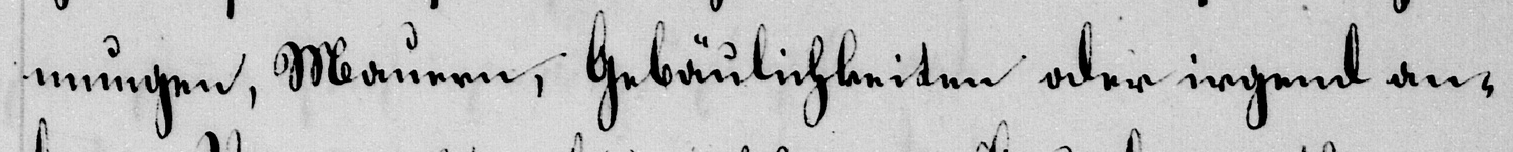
nungen, Mauern, Gebäulichkeiten oder irgend an¬
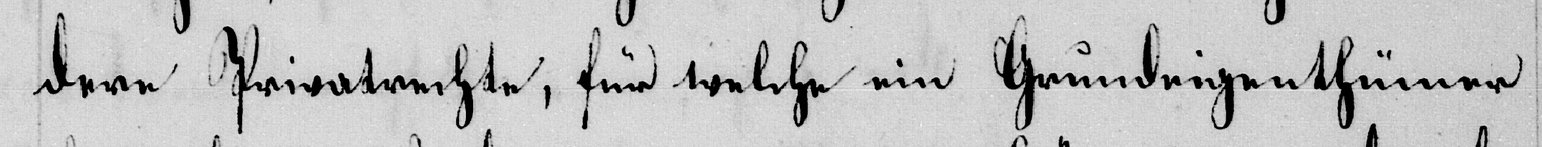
dere Privatrechte, für welche ein Grundeigenthümer
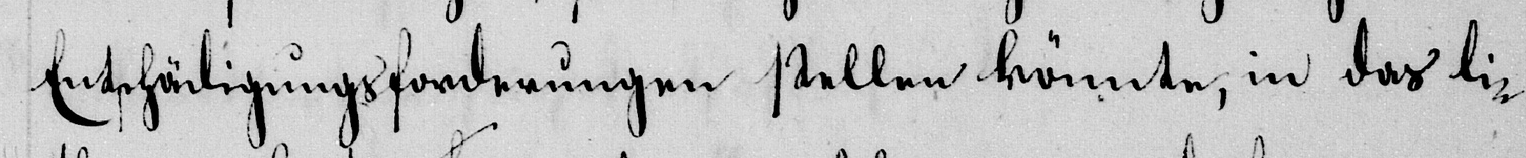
Entschädigungsforderungen stellen könnte, in das li¬
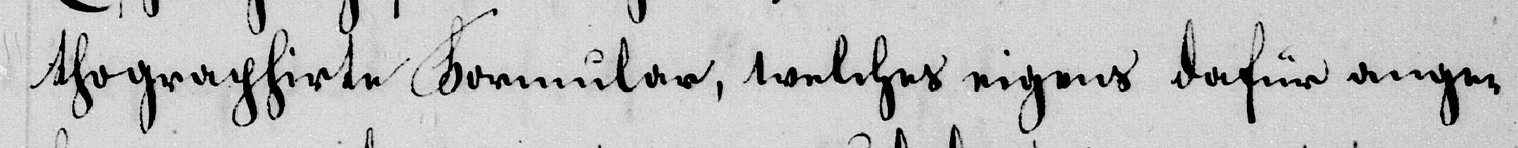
thographirte Formular, welches eigens dafür ange¬
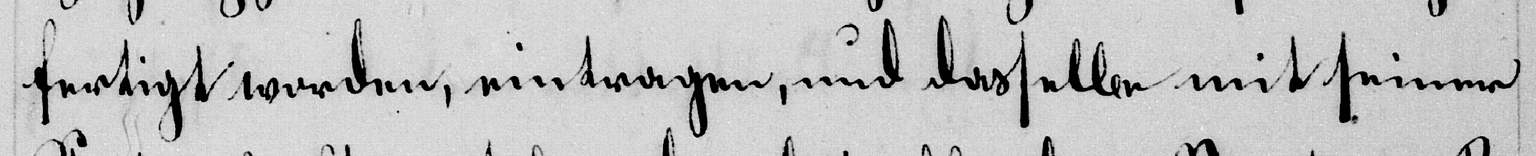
fertigt worden, eingetragen, und dasselbe mit seiner
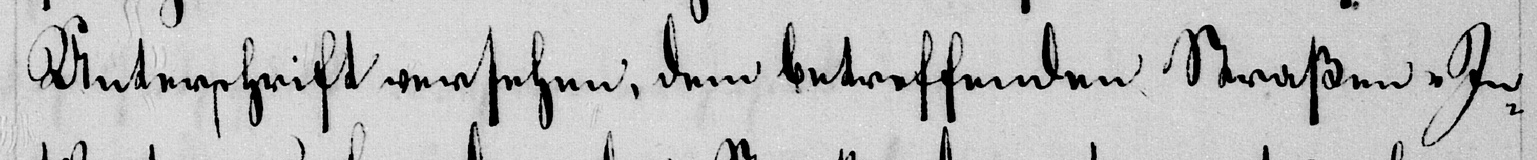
Unterschrift versehen, dem betreffenden Straßen-In¬
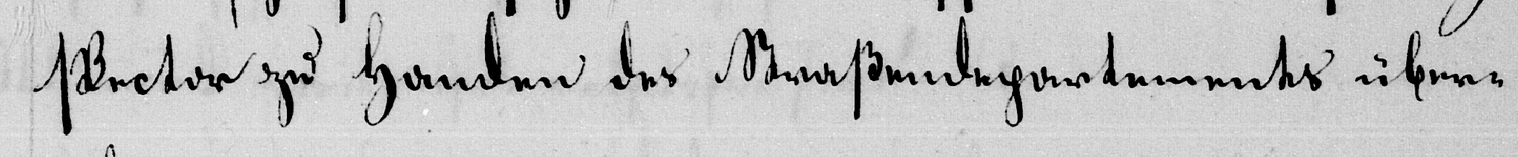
spector zu Handen des Straßendepartements über¬
